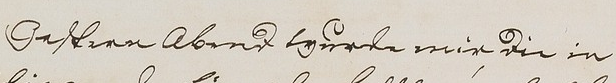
Gestern Abend wurde mir die in
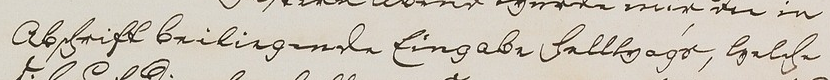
Abschrift beiliegende Eingabe Hellwag's, welche
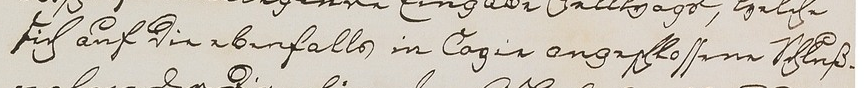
sich auf die ebenfalls in Copie angeschlossene Schluß-
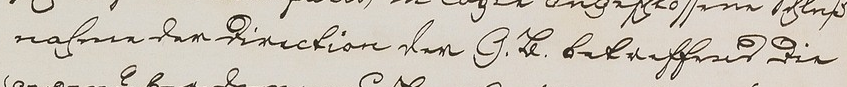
nahme der Direction der G.B. betreffend die
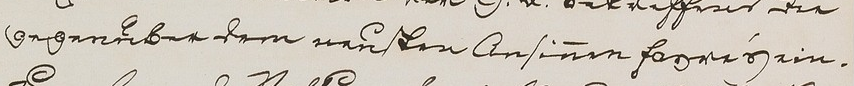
gegenüber dem neusten Ansinnen Favre's ein-
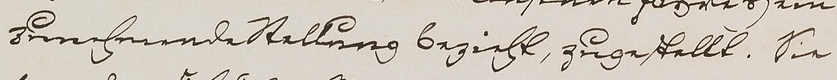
zunehmende Stellung bezieht, zugestellt. Sie
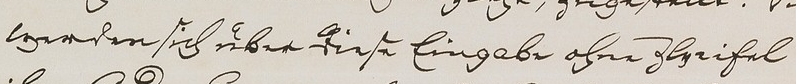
werden sich über diese Eingabe ohne Zweifel
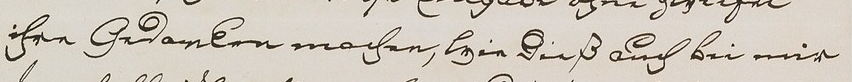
ihre Gedanken machen, wie dieß auch bei mir
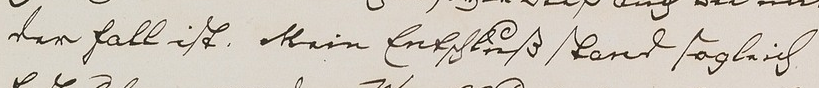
der Fall ist. Mein Entschluß stand sogleich
